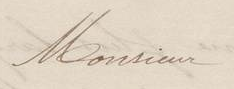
Monsieur
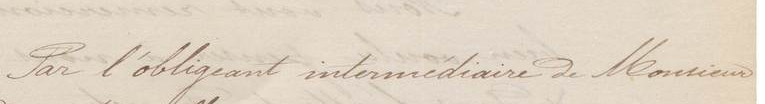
Par l'obligeant intermédiaire de Monsieur
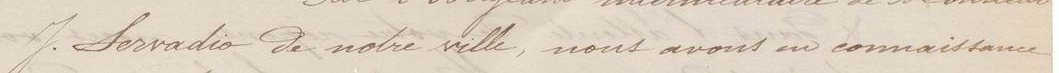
J. Servadio de notre ville, nous avons eu connaissance
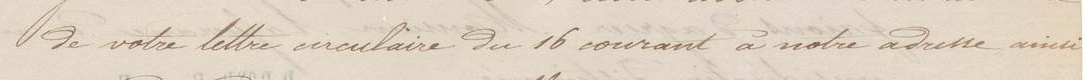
de votre lettre circulaire du 16 courant à notre adresse ainsi
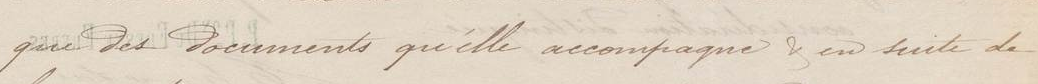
que des documents qu'elle accompagne & en suite de
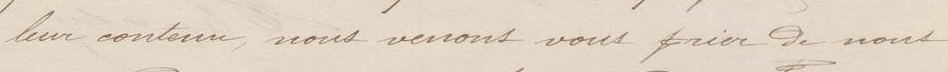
leur contenu, nous venons vous prier de nous
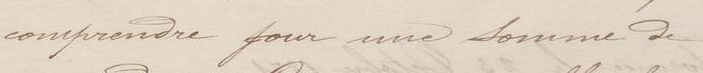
comprendre pour une somme deF
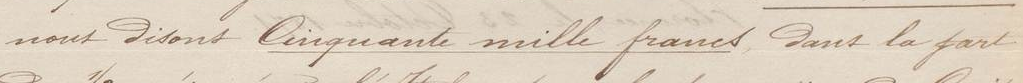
nous disons Cinquante mille francs, dans la part
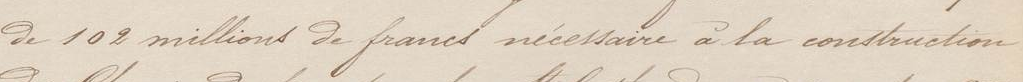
de 102 millions de francs nécessaire à la construction
